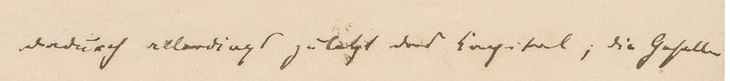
dadurch allerdings zuletzt das Capital; die Gesell-
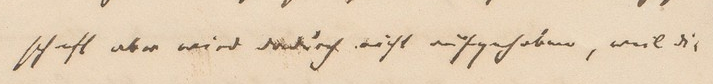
schaft aber wird dadurch nicht aufgehoben, weil die
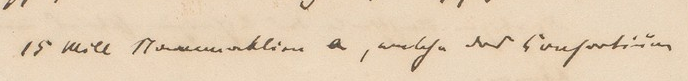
15 Mill Stammaktien a, welche das Consortium
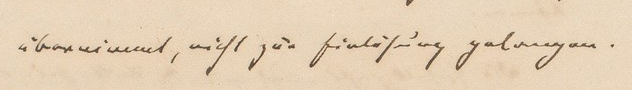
übernimmt, nicht zur Einlösung gelangen.
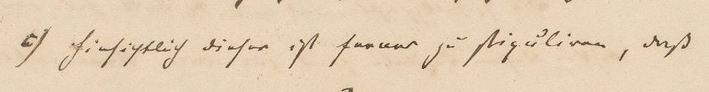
c) Hinsichtlich dieser ist ferner zu stipuliren, daß
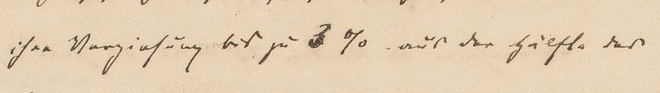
ihre Verzinsung bis zu 3% aus der Hälfte des
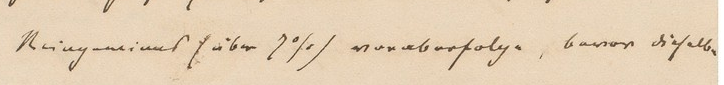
Reingewinns (über 7%) vorab erfolge, bevor dieselbe
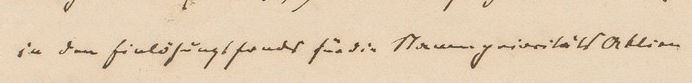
in den Einlösungsfonds für die StammprioritätsAktien
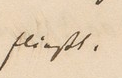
fließt.
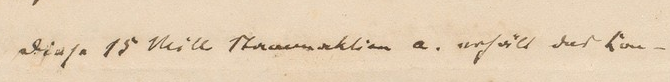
Diese 15 Mill Stammaktien a. erhält das Con-
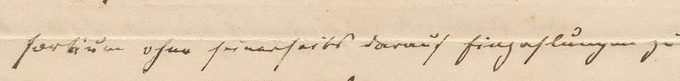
sortium ohne seinerseits darauf Einzahlungen zu
